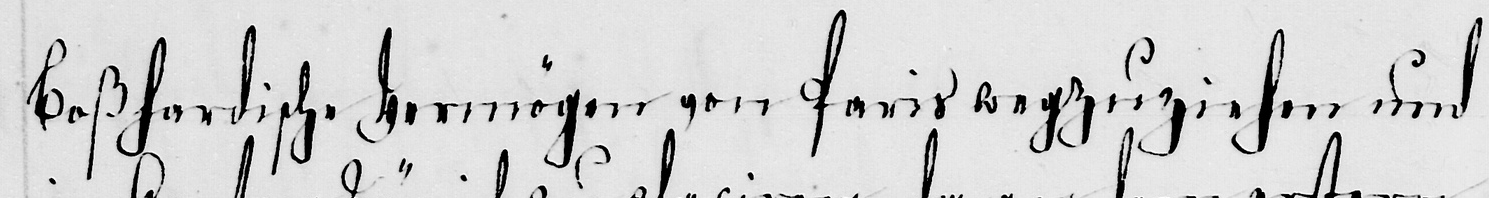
Boßhardische Vermögen von Paris wegzuziehen und
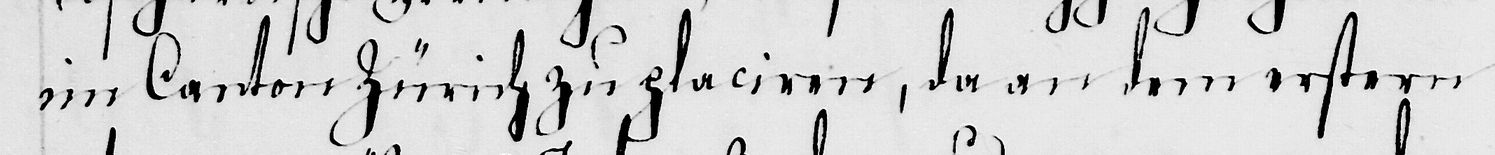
im Canton Zürich zu placiren, da an dem erstern
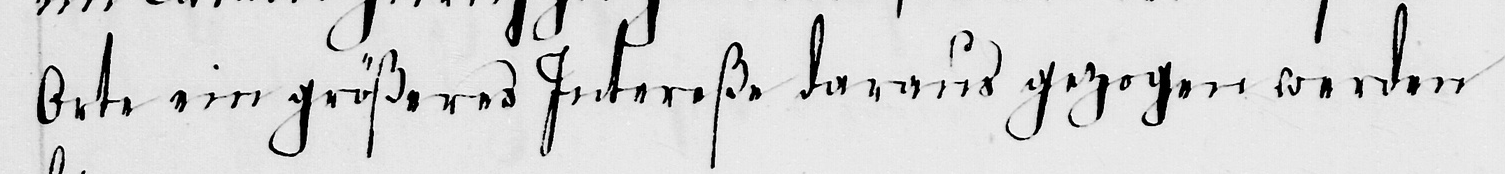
Orte ein größeres Intereße daraus gezogen werden
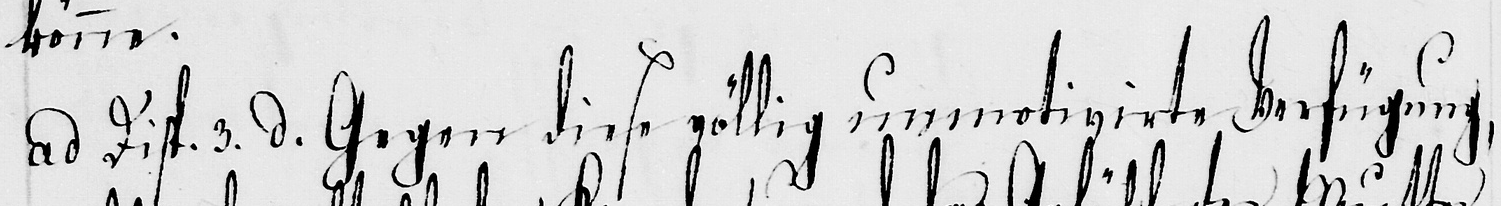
ad Disp. 3 d. Gegen diese völlig unmotivirte Verfügung,
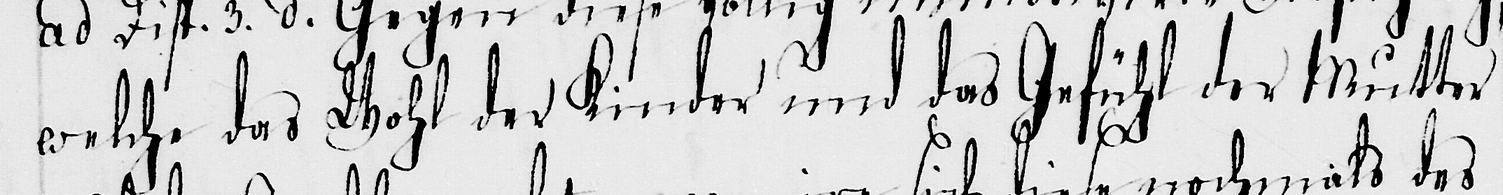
welche das Wohl der Kinder und das Gefühl der Mutter
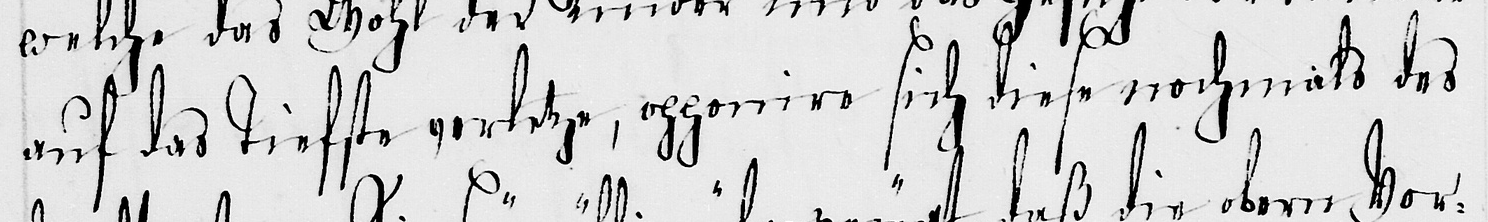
auf das Tiefste verletze, opponire sich diese nochmals des
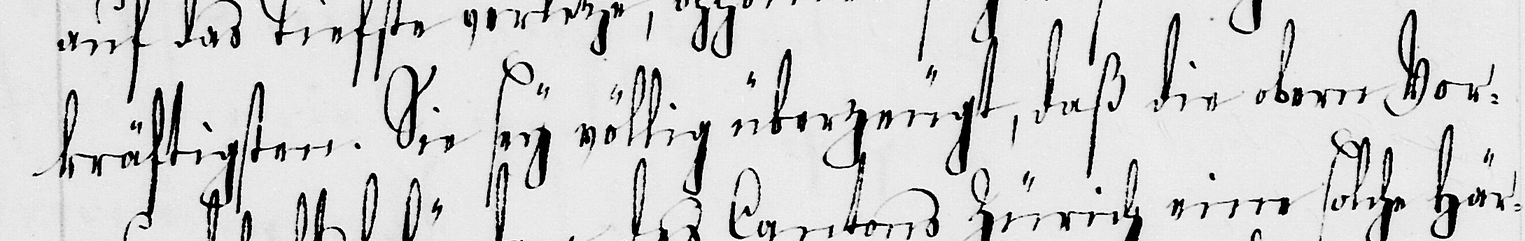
kräftigsten. Sie sey völlig überzeugt, daß die obern Vor¬
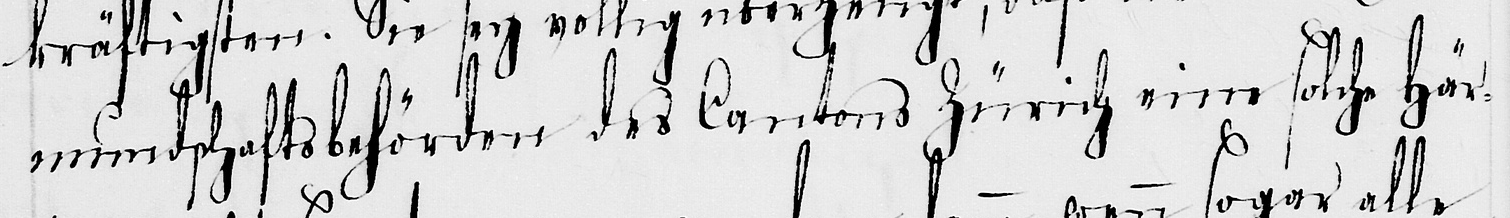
mundschaftsbehörden des Cantons Zürich eine solche Här¬
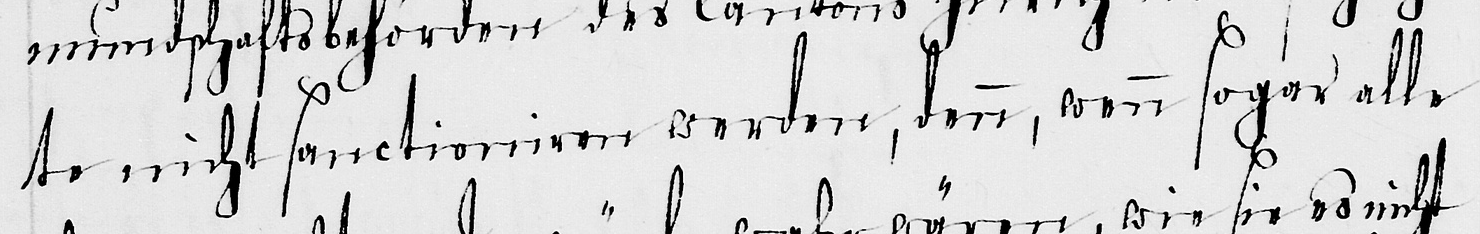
te nicht sanctioniren werden, denn, wenn sogar alle
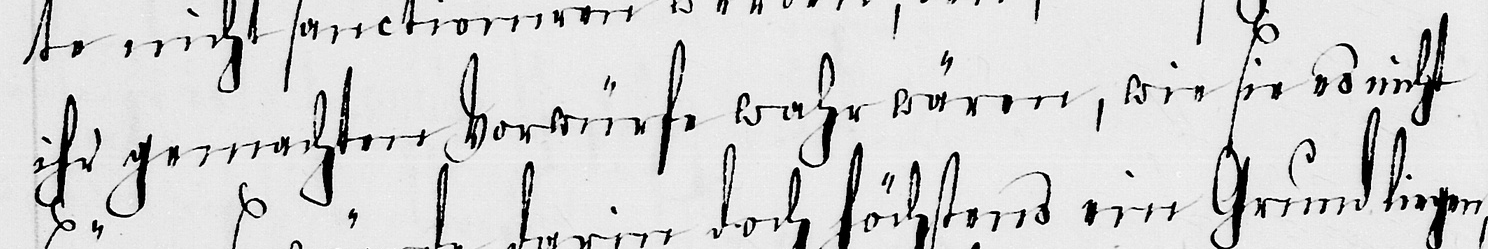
ihr gemachten Vorwürfe wahr wären, wie sie es nicht
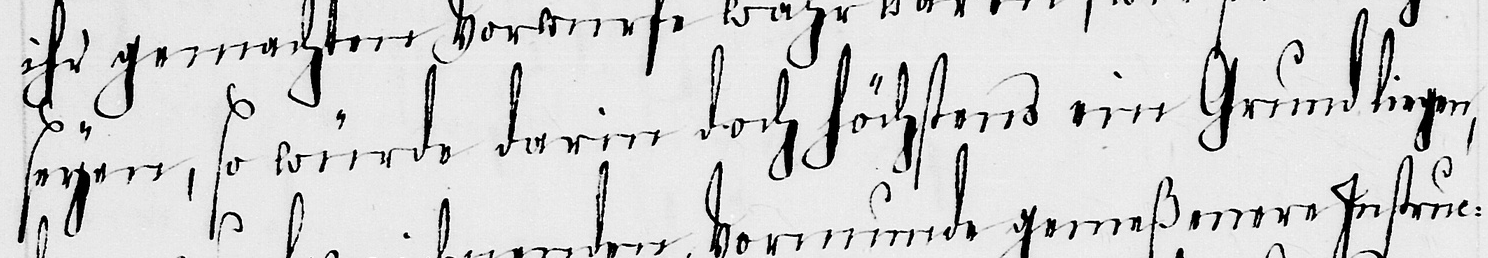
seyen, so würde darin doch höchstens ein Grund lie¬
